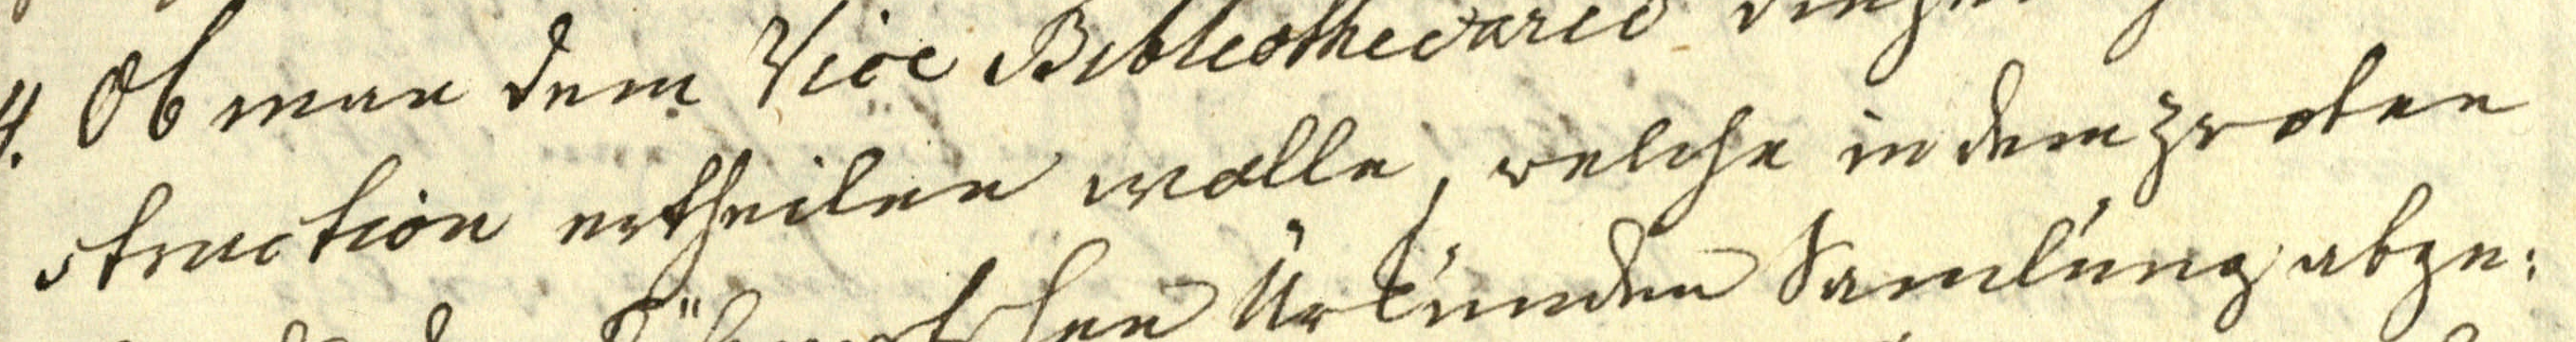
struction ertheilen wolle, welche in dem zwoten
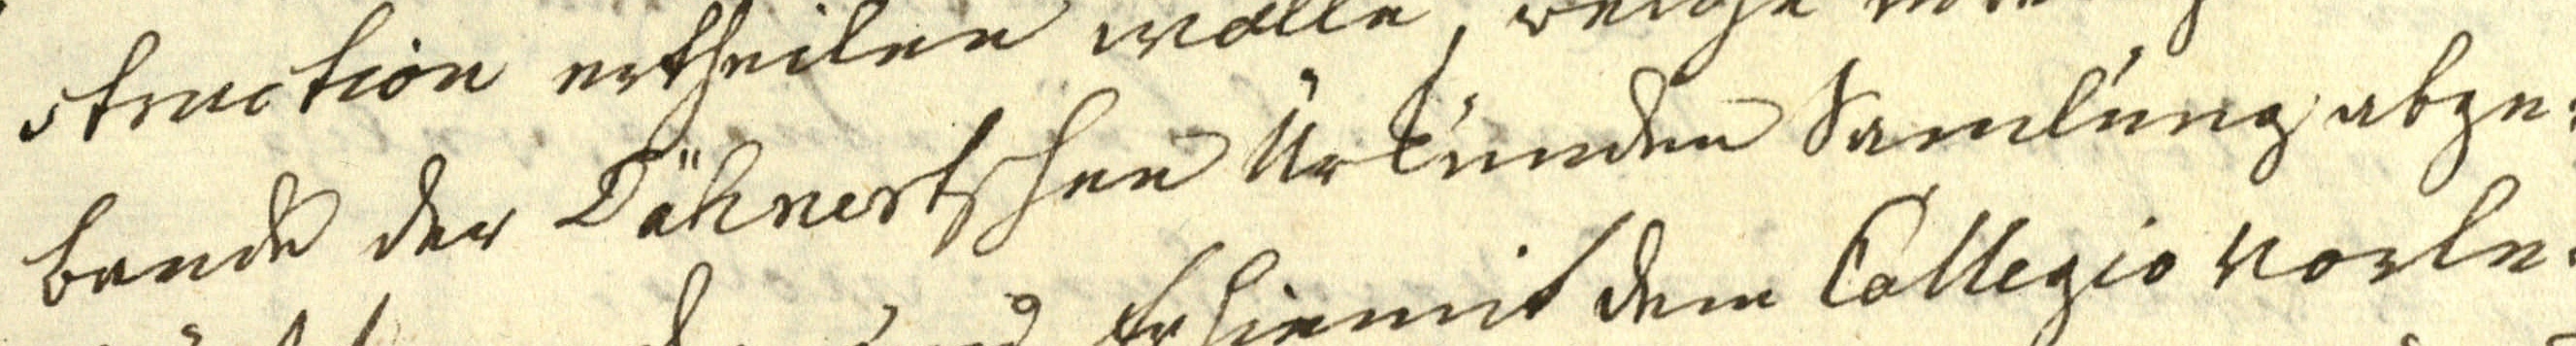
Bande der Dähnertschen Urkunden Samlung abge¬
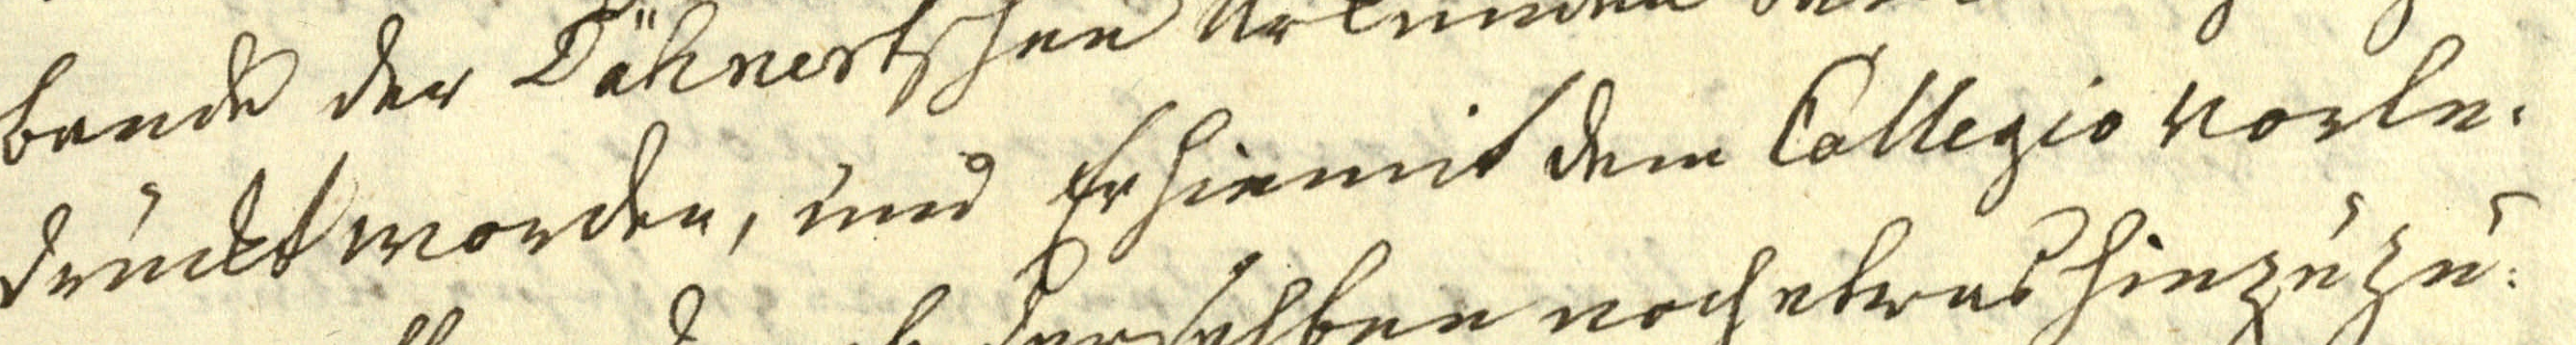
druckt worden, und Er hiemit dem Collegio vorle¬
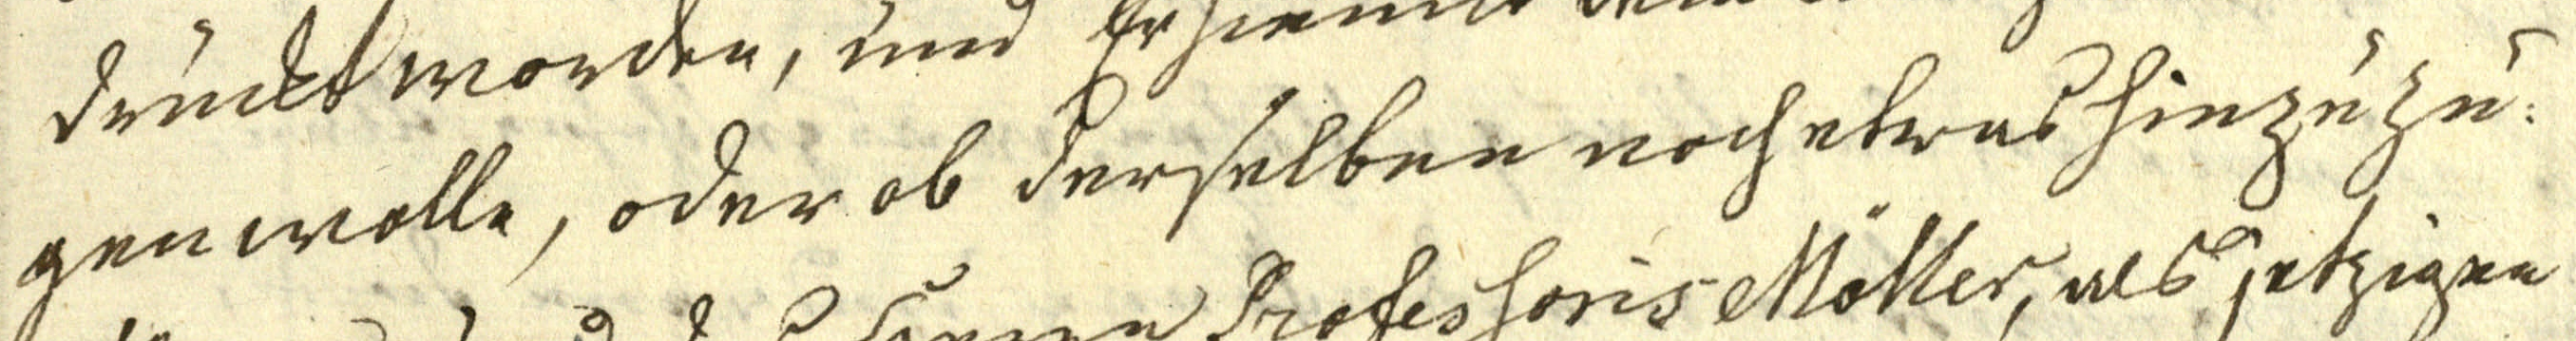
gen wolle, oder ob derselben nochetwas hinzuzu¬
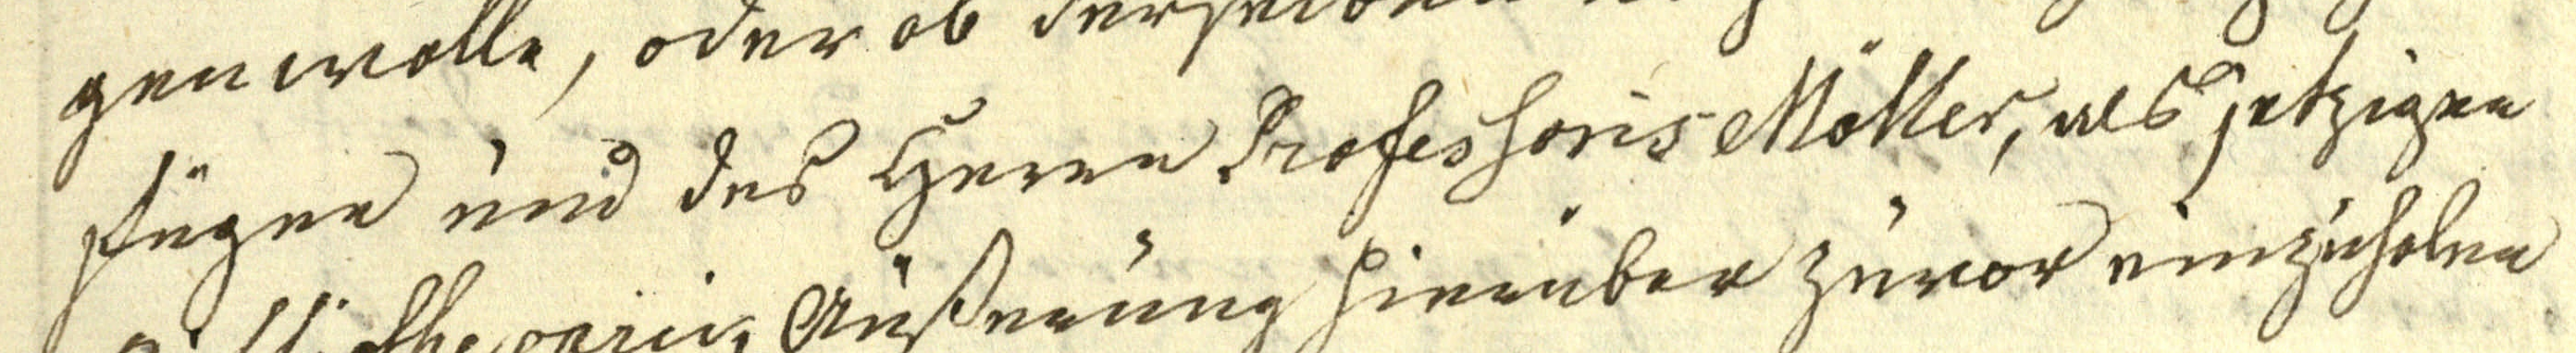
fügen und des Herrn Professoris Möller, als jetzigen
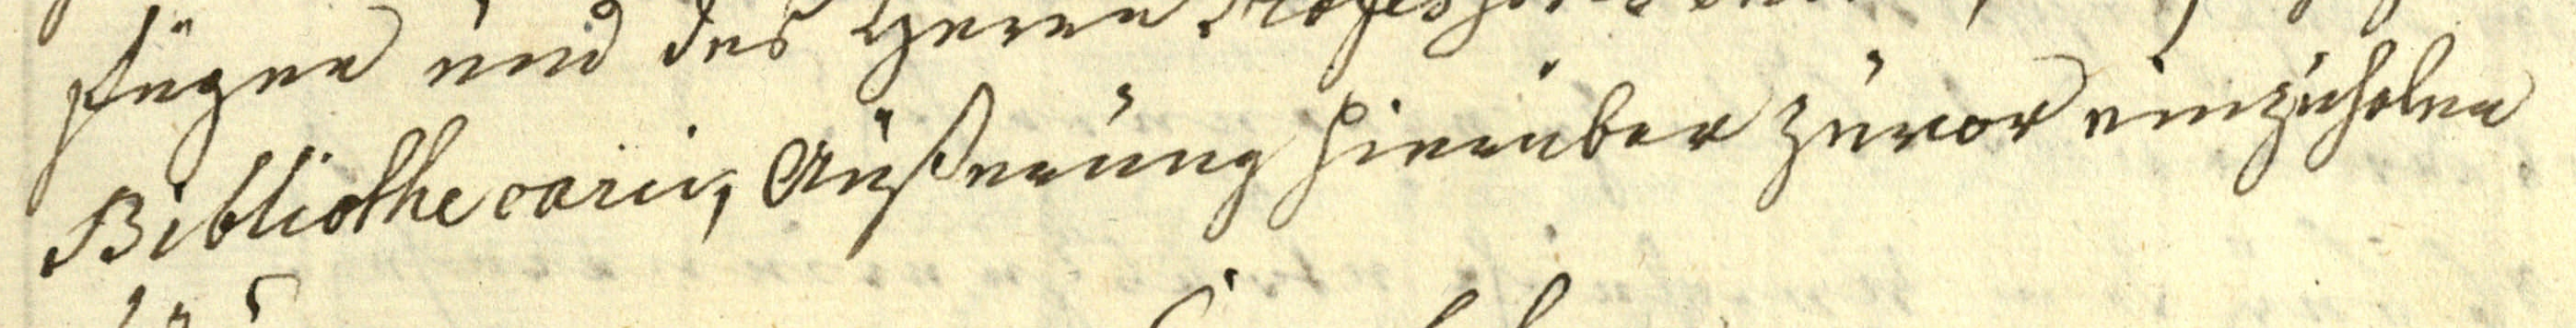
Bibliothecarii, Äußerung hierüber zuvor einzuholen
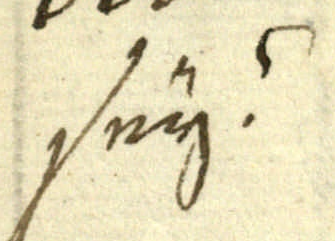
seÿ?
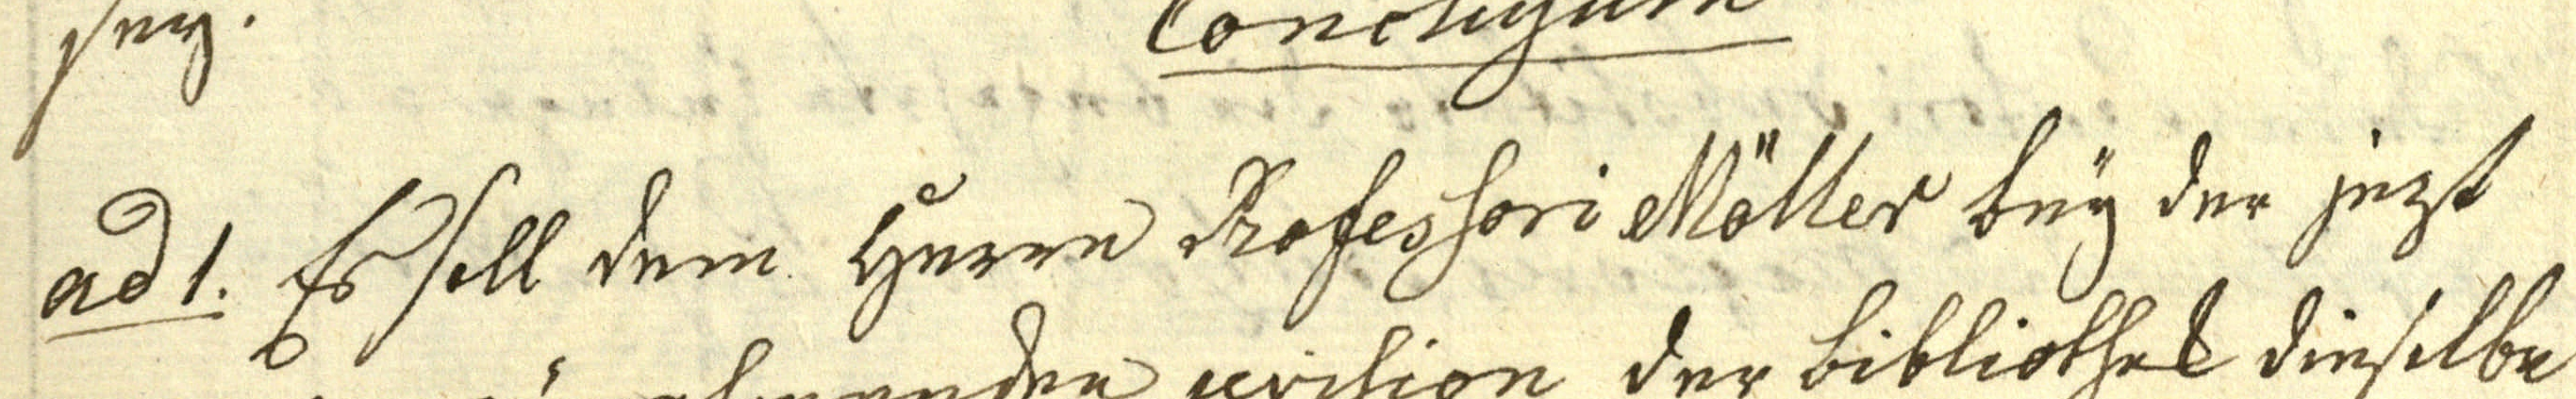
ad 1. Es soll dem Herrn Professori Möller bei der jezt
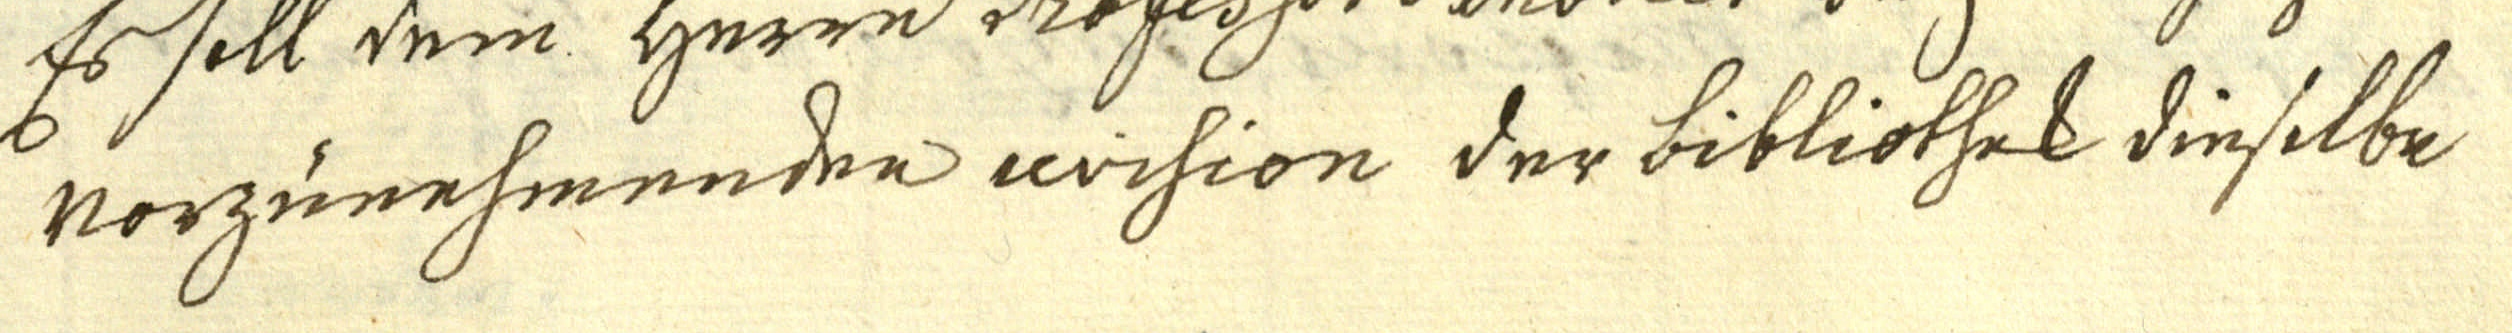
vorzunehmenden revision der Bibliothek dieselbe
